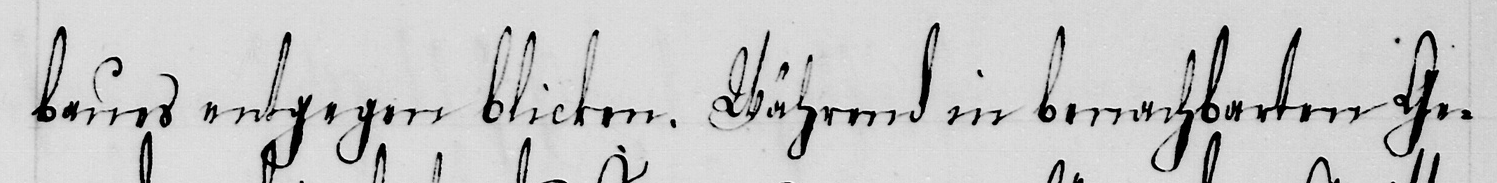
baues entgegen blicken. Während in benachbarten Ge¬
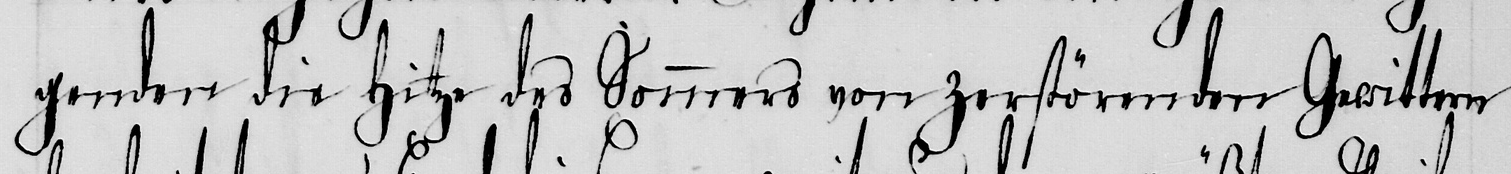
genden die Hitze des Sommers von zerstörenden Gewittern
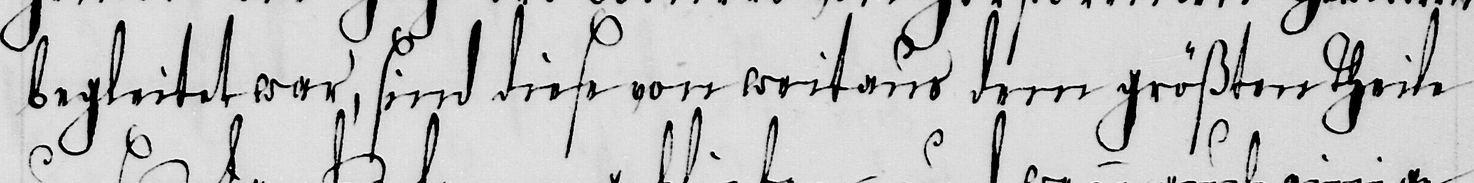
begleitet war, sind diese von weitaus dem größten Theile
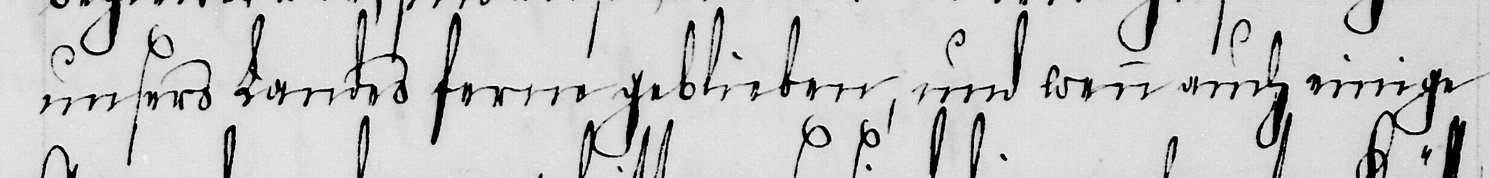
unsers Landes ferne geblieben, und wenn auch einige
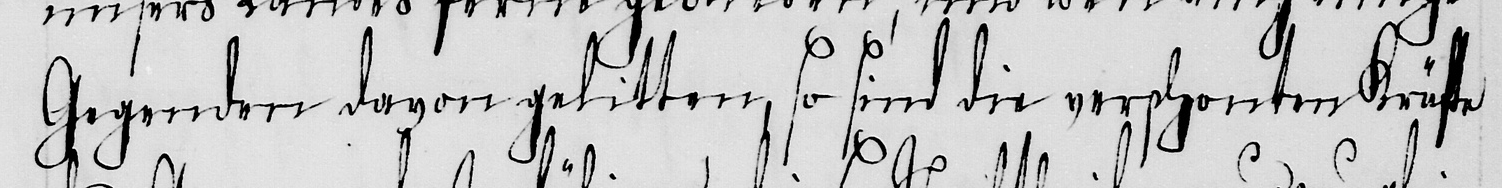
Gegenden davon gelitten, so sind die verschonten Kräfte
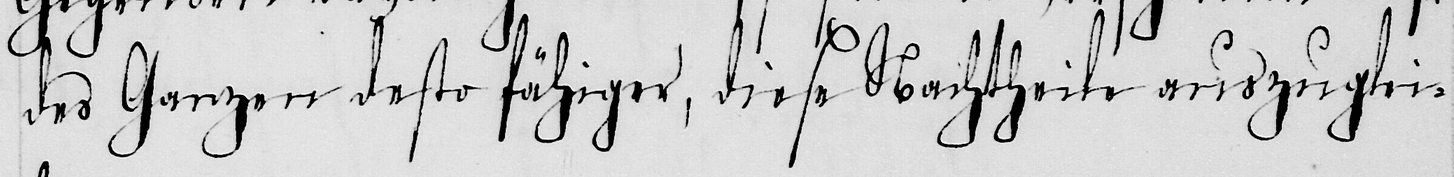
des Ganzen desto fähiger, diese Nachtheile auszuglei¬
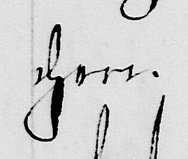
chen.
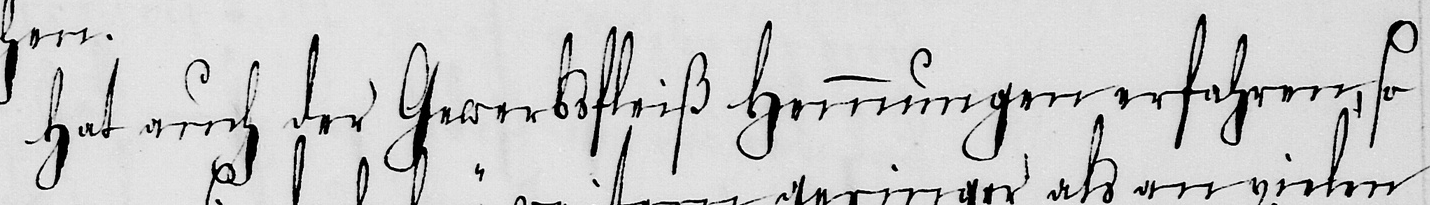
Hat auch der Gewerbsfleiß Hemmungen erfahren, so
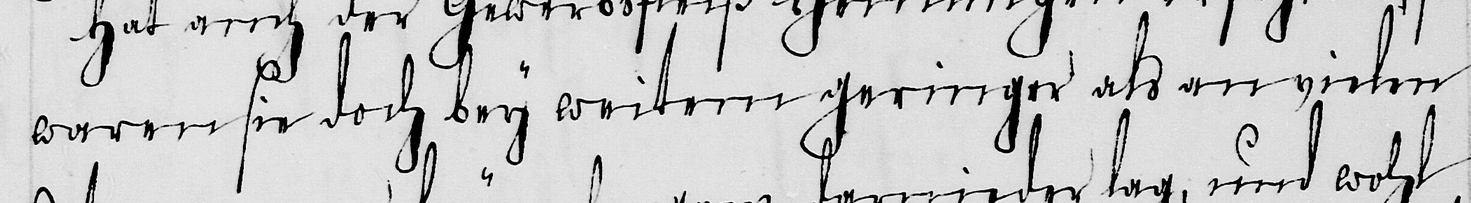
waren sie doch bey weitem geringer als an vielen
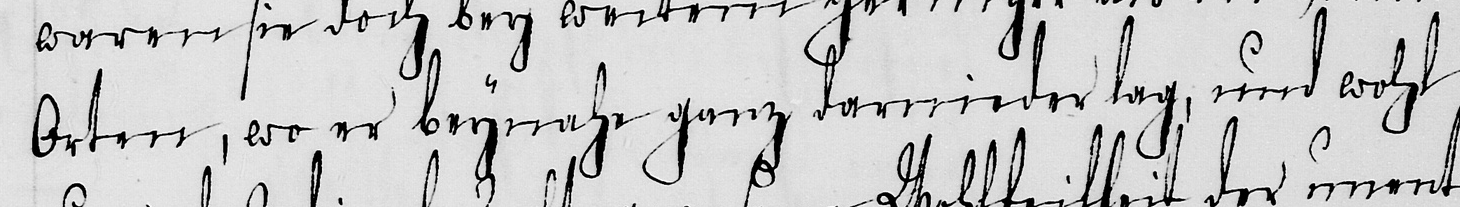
Orten, wo er beynahe ganz darnieder lag, und wohl
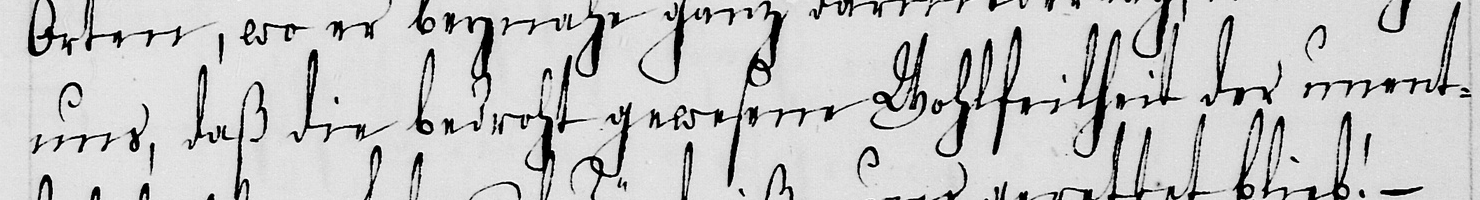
uns, daß die bedroht gewesene Wohlfeilheit der unent¬
